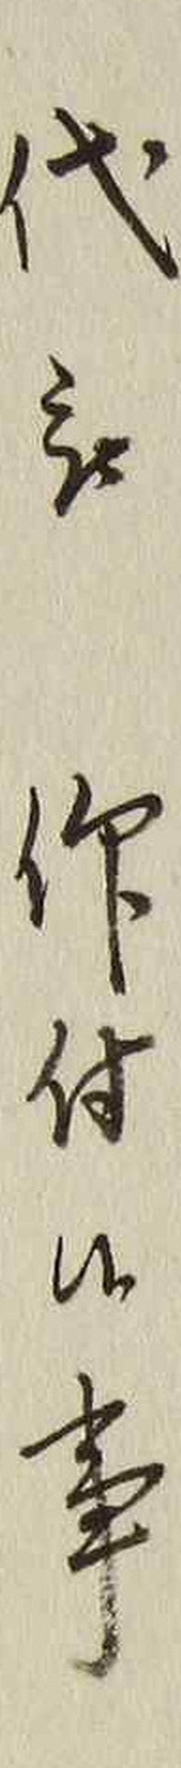代被仰付候事
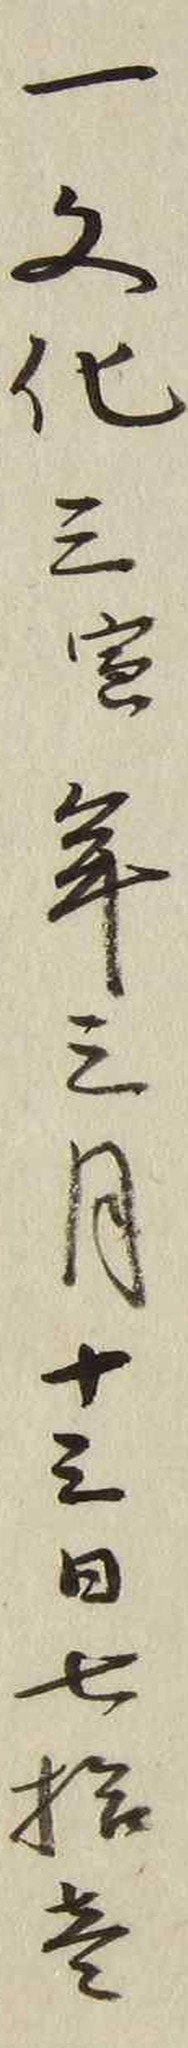一文化三寅年三月十三日七拾壱
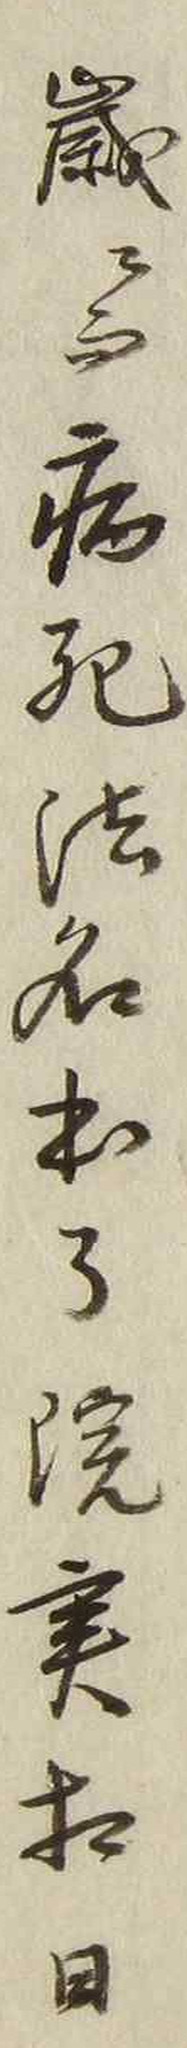歳ニ而病死法名書了院実相日

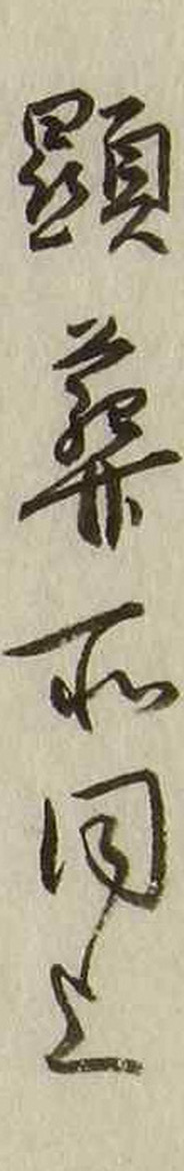顕葬所同上
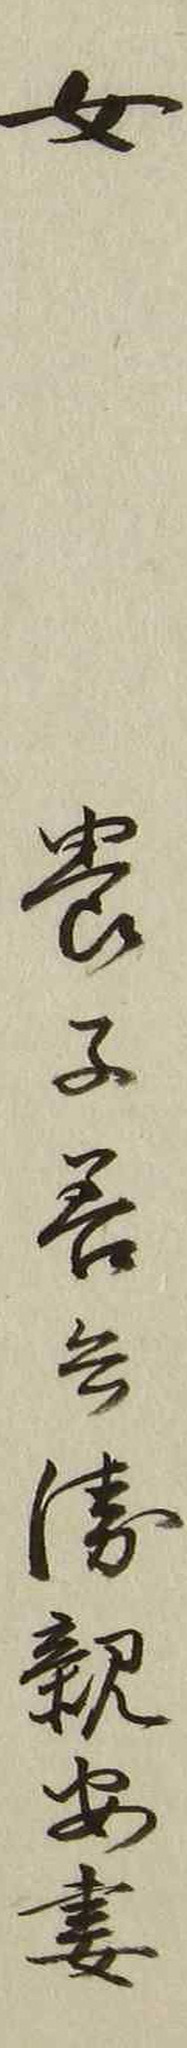女養子善兵衛親安妻
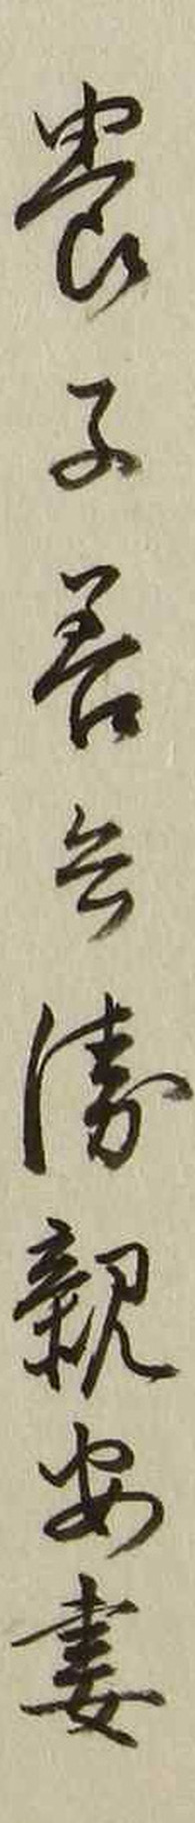女養子善兵衛親安妻
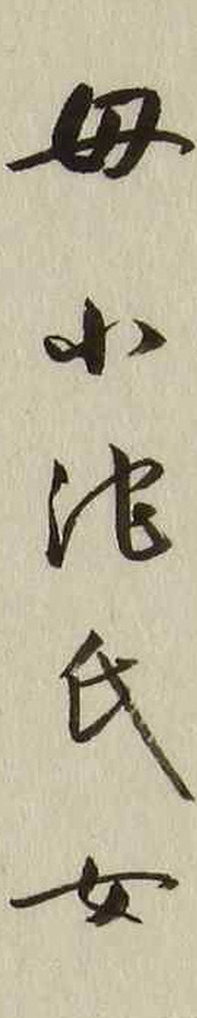母小池氏女
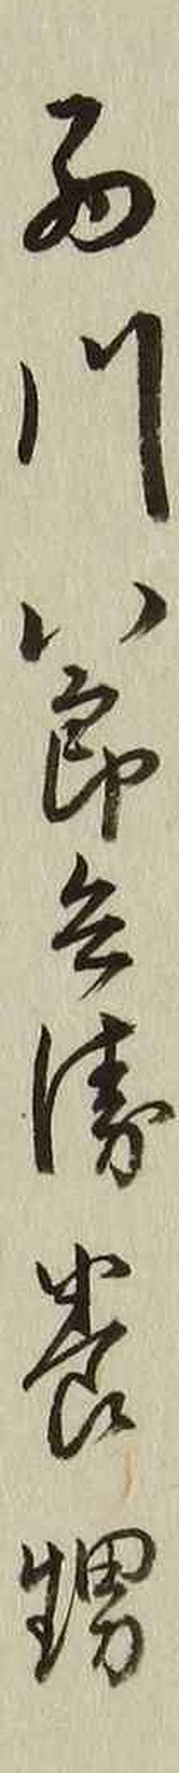西川八郎兵衛養甥
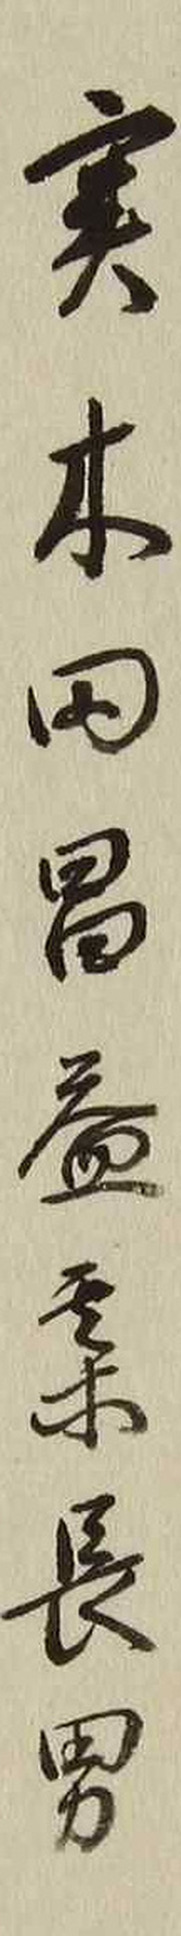実木田昌益某長男
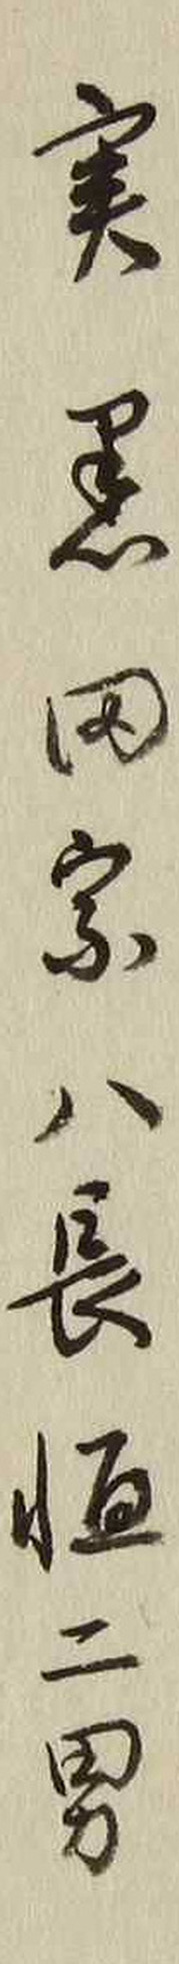実黒田宗八長恒二男
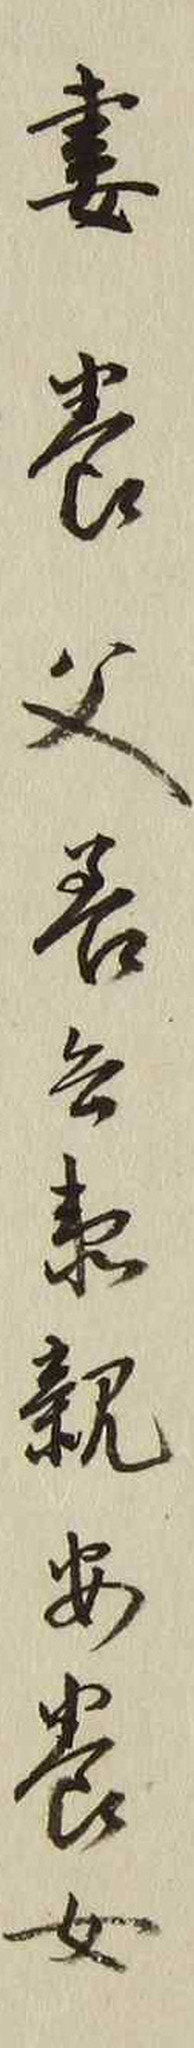妻養父善兵衛親安養女
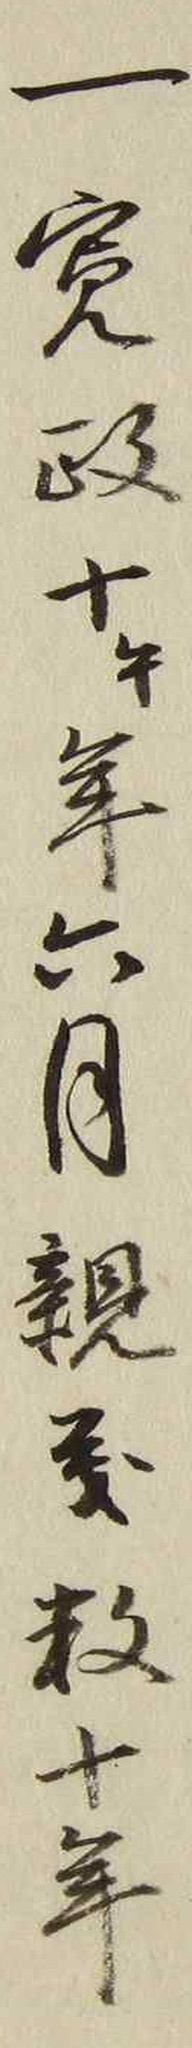一寛政十午年六月親義数十年
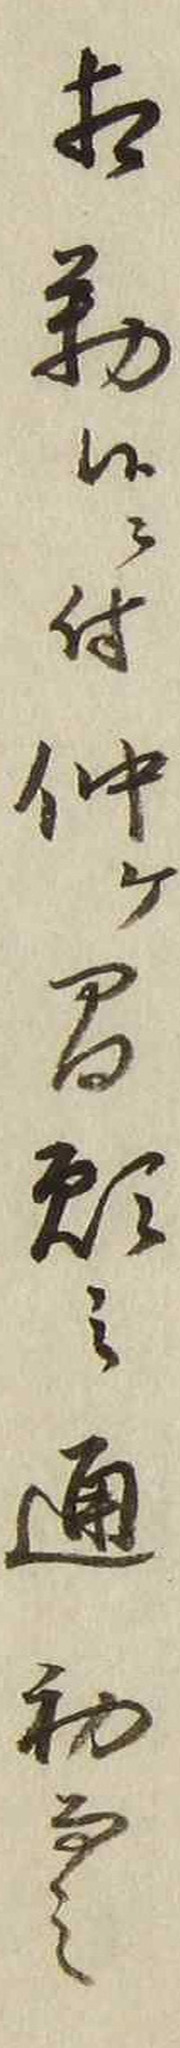相勤候ニ付仲ケ間願之通初而之

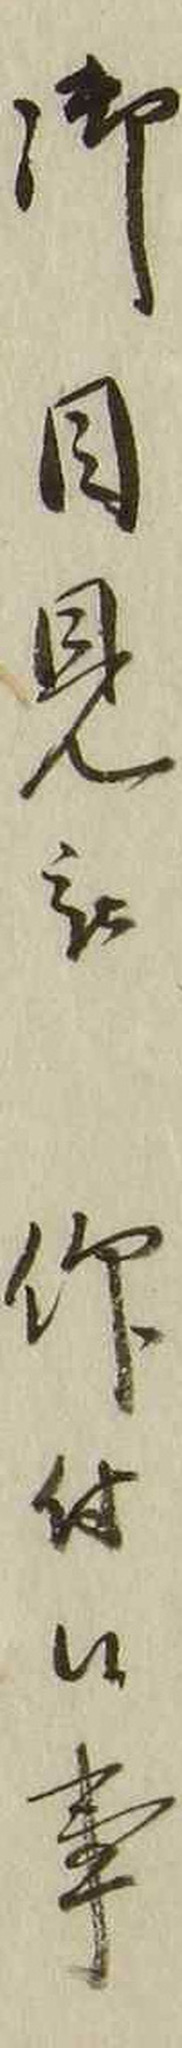御目見被仰付候事
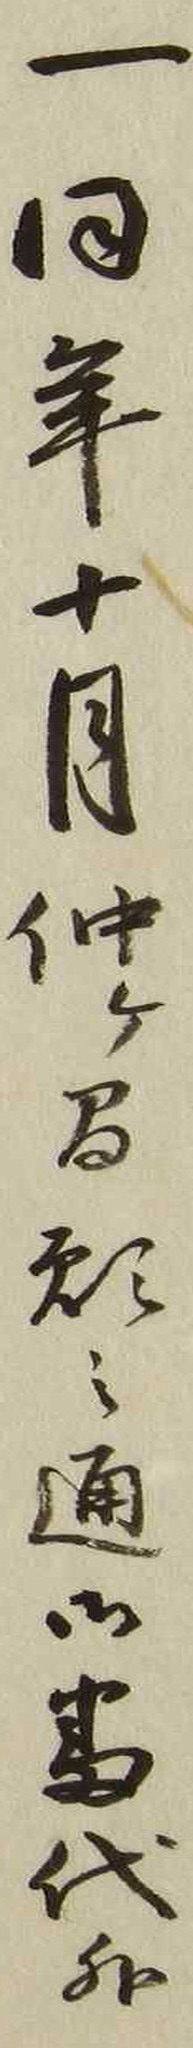一同年十月仲ケ間願之通御番代外
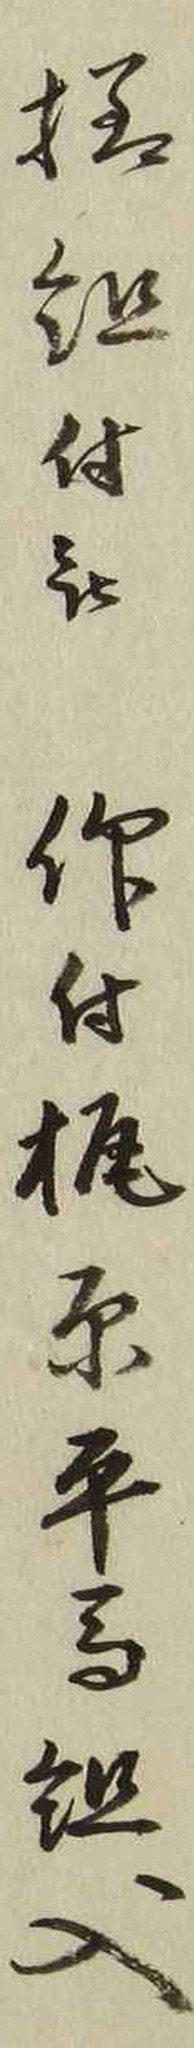様組付被仰付梶原平馬組へ入
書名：諸士系譜　巻之149　そ之部2
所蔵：会津若松市立会津図書館
